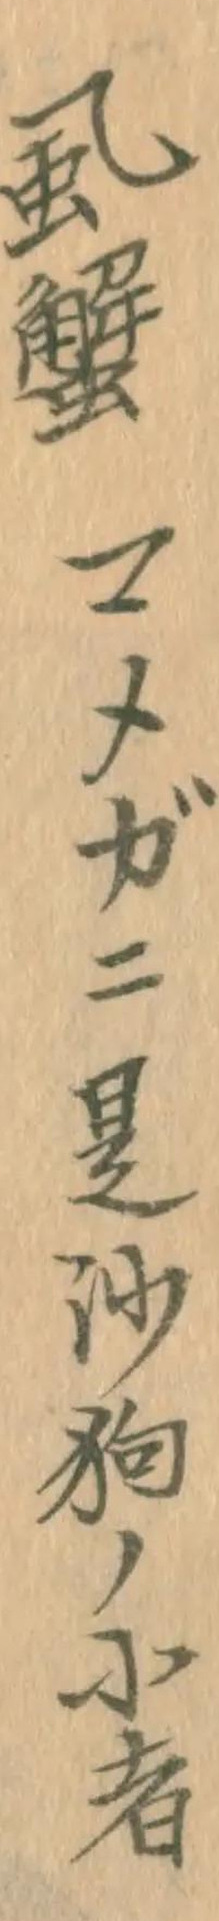虱蟹マメガニ是沙狗ノ小者
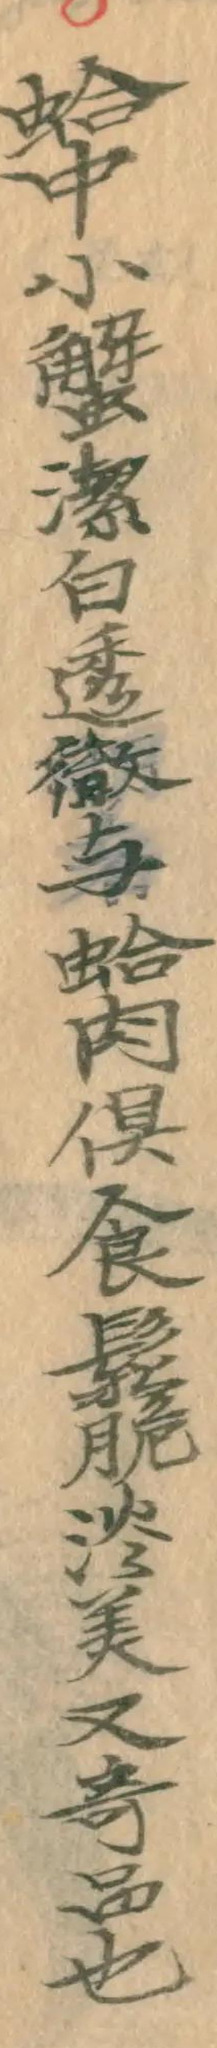◦蛤中小蟹潔白透徹与蛤肉倶食鬆脆淡美又奇品也
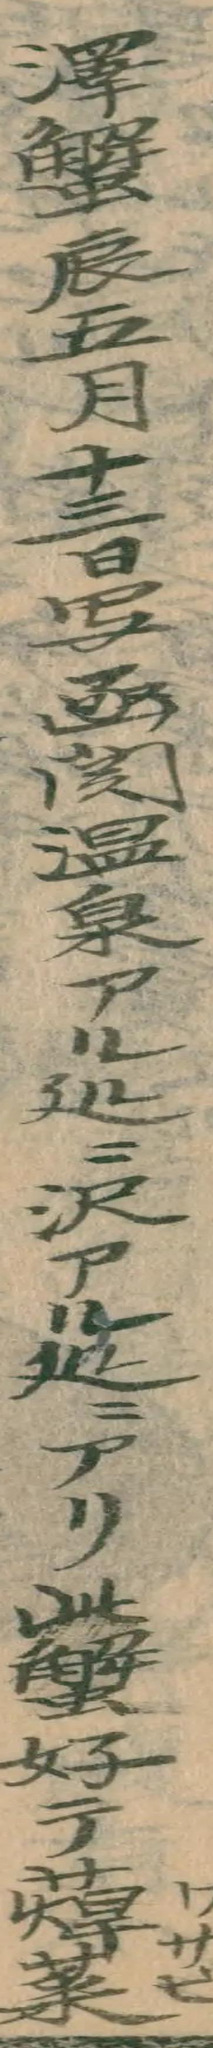澤蟹辰五月十三日写凾関温泉アル処ニ沢アル処ニアリ此蟹好テ蔊菜
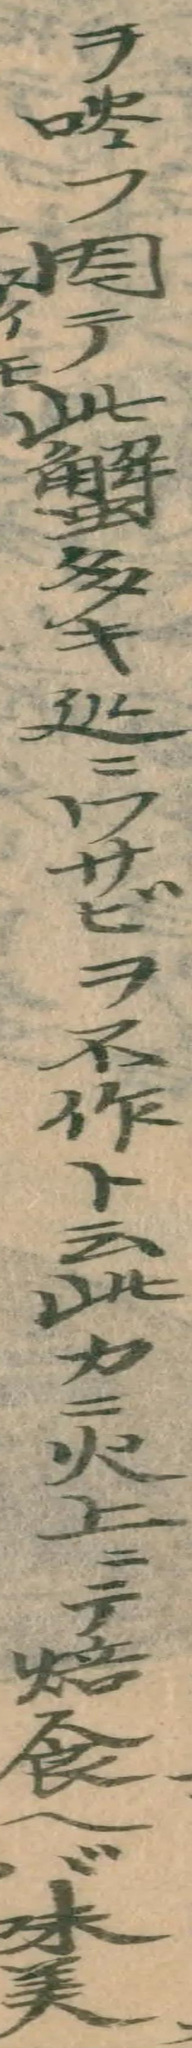ヲ啖フ因テ此蟹多キ処ニワサビヲ不作ト云此カニ火上ニテ焙食ヘバ味美
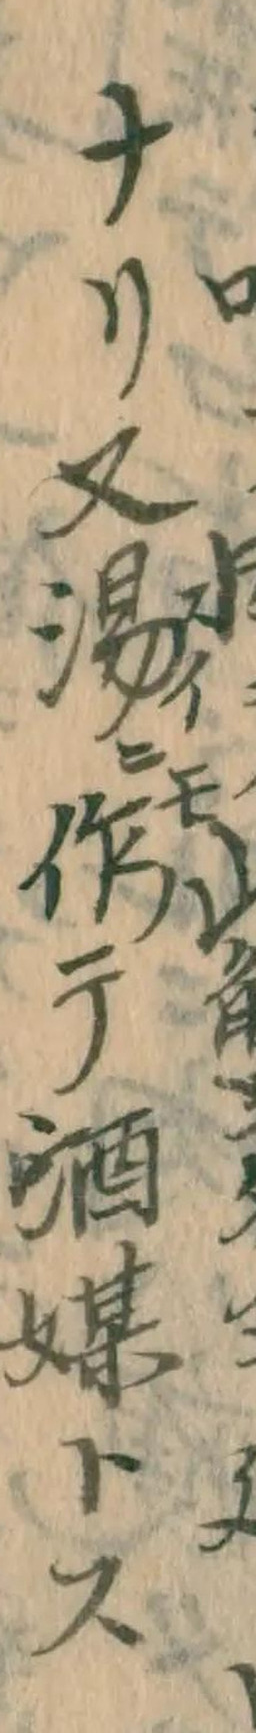ナリ又湯ニ作テ酒媒トス

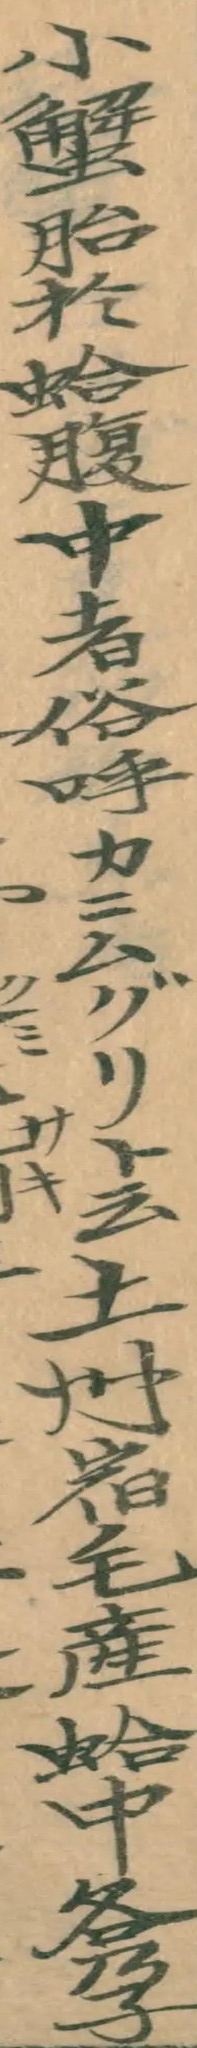小蟹胎於蛤腹中者俗呼カニムグリト云土州宿毛産蛤中各乃子
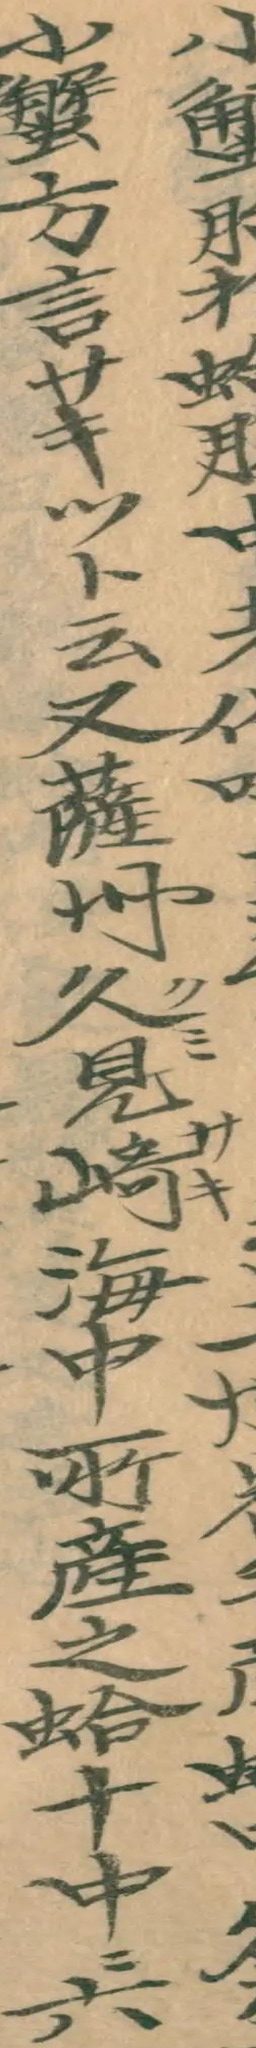小蟹方言サキツト云又薩州久見崎海中所産之蛤十中ニ六
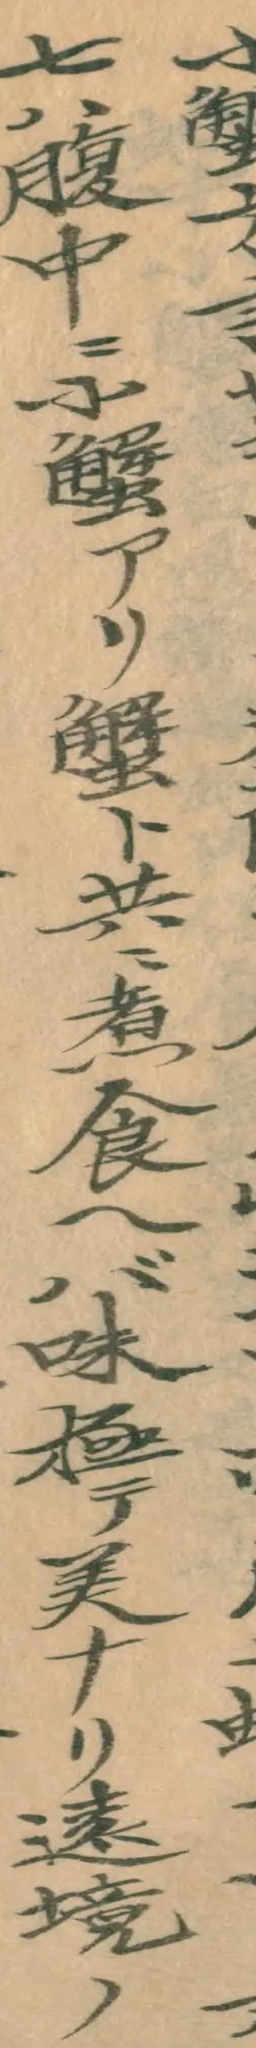七ハ腹中ニ小蟹アリ蟹ト共ニ煮食ヘバ味極テ美ナリ遠境ノ
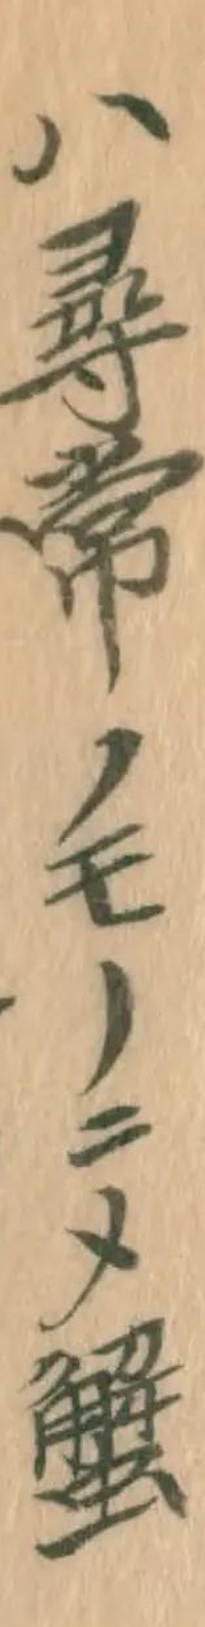ハ尋常ノモノニシテ蟹
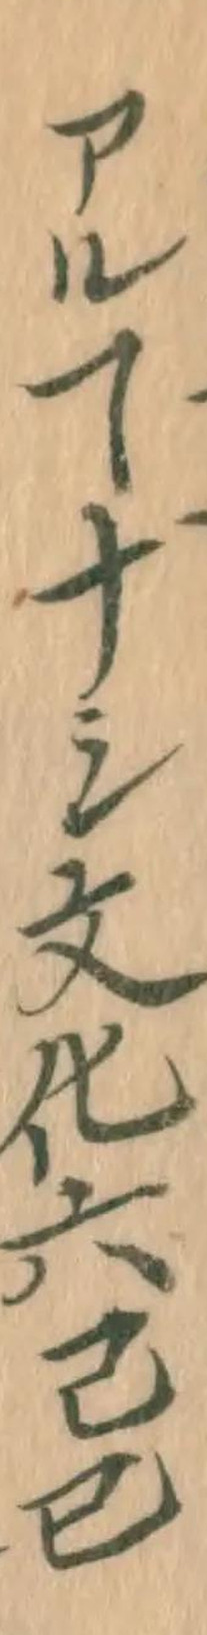アルコトナシ文化六己巳
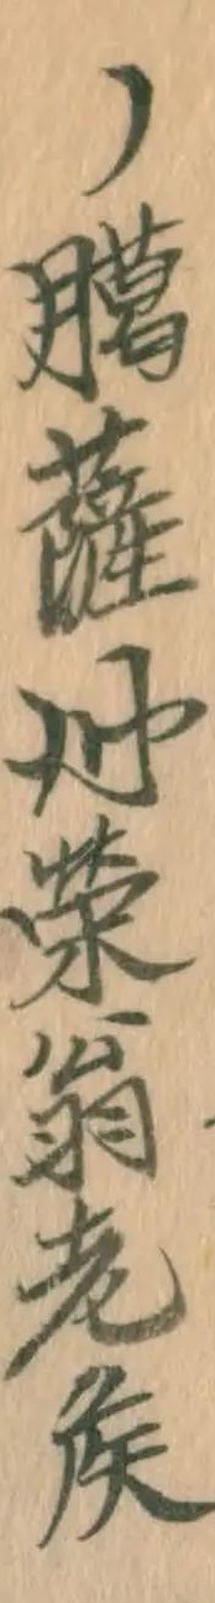ノ臈薩州榮翁老矦
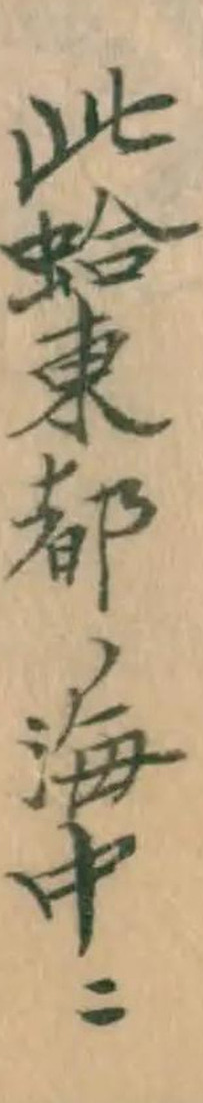此蛤東都ノ海中ニ
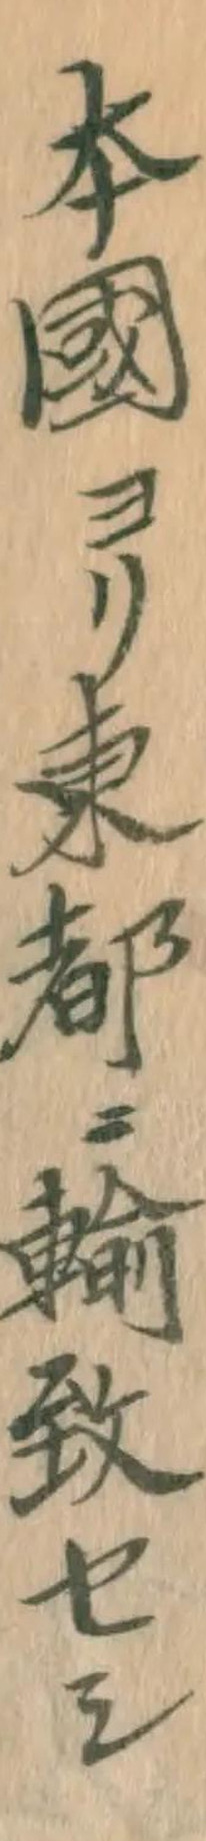本國ヨリ東都ニ輸致セシ
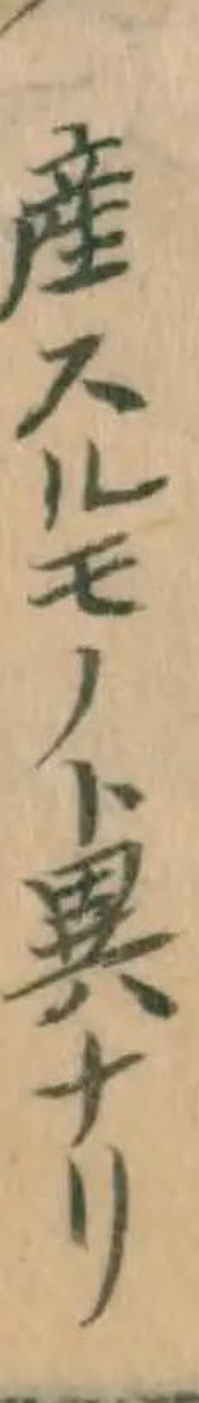産スルモノト異ナリ
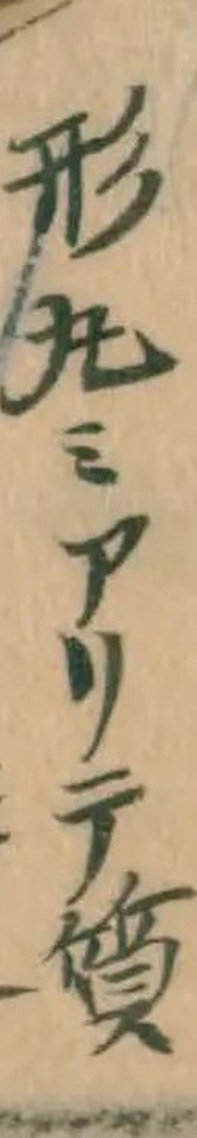形丸ミアリテ質
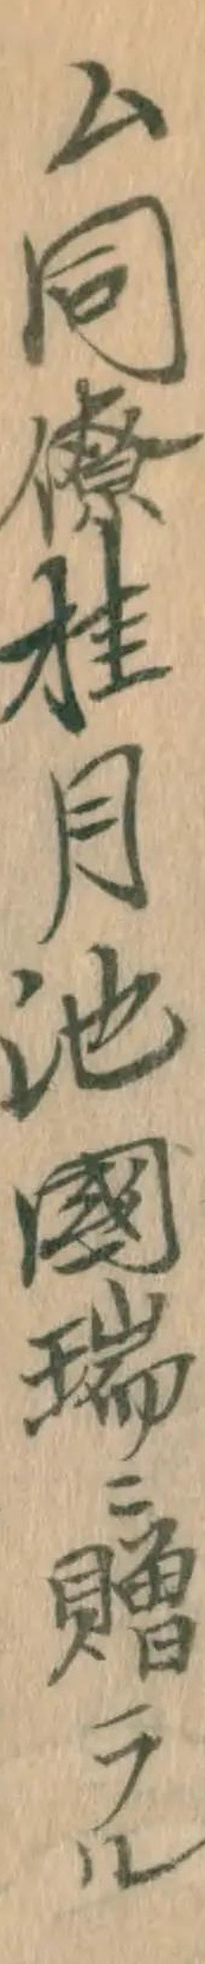ム同僚桂月池國端ニ贈ラル
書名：千蟲譜 3巻. [2]
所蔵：国立国会図書館 National Diet Library, JAPAN
